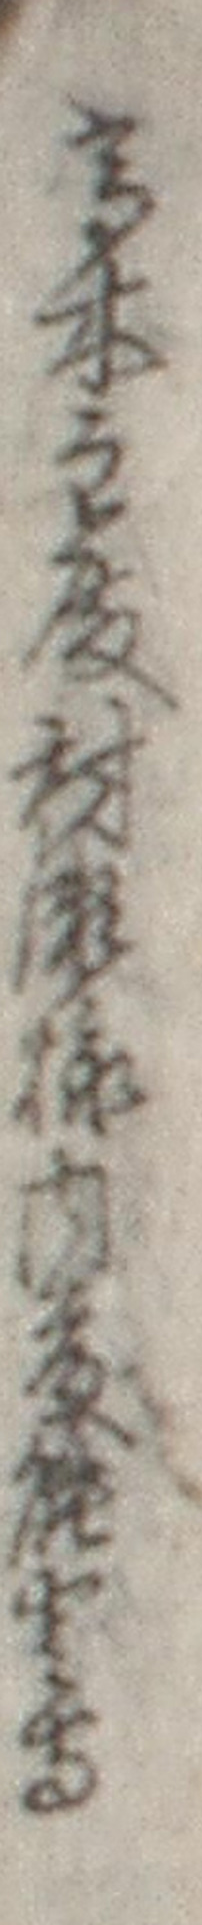高木主殿村瀬様内藤能登守

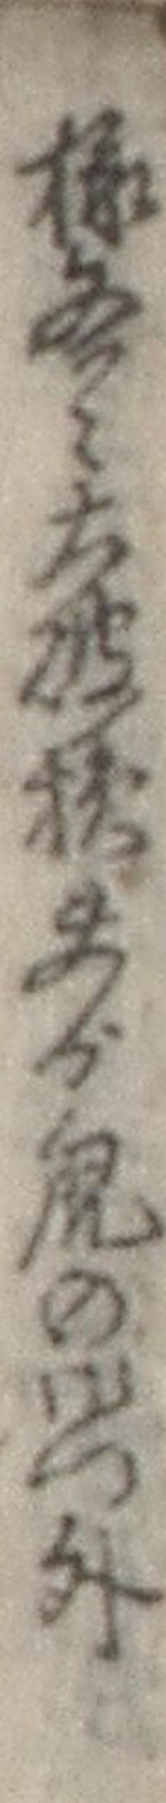様各〻大破損夫ゟ虎の御門外
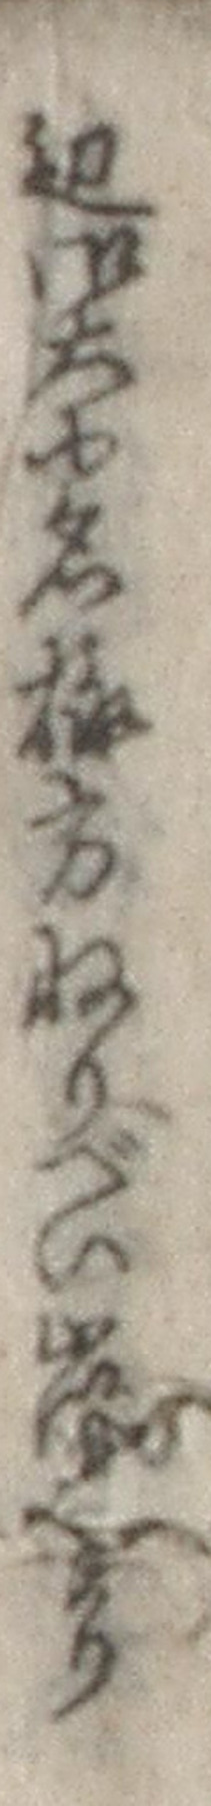辺御大小名様方ねりべひ崩夫より
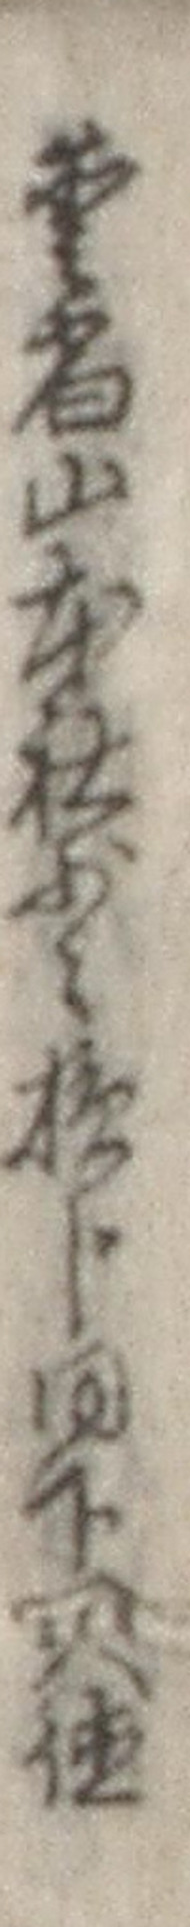愛宕山本社少〻損じ同下天徳
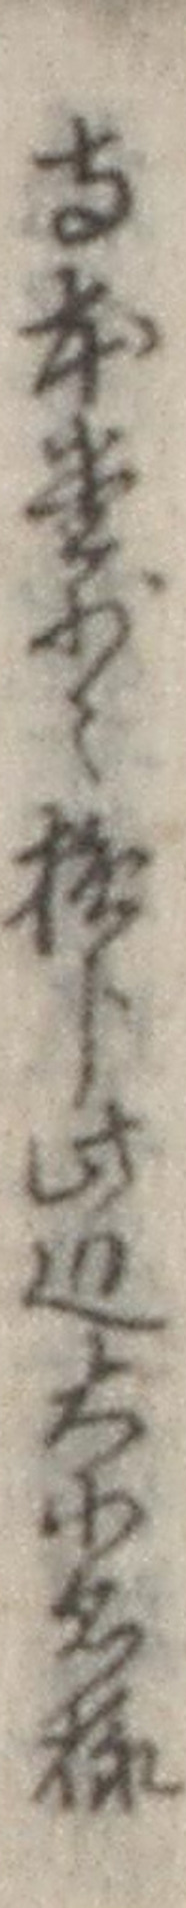寺本堂少〻損じ此辺大小名様
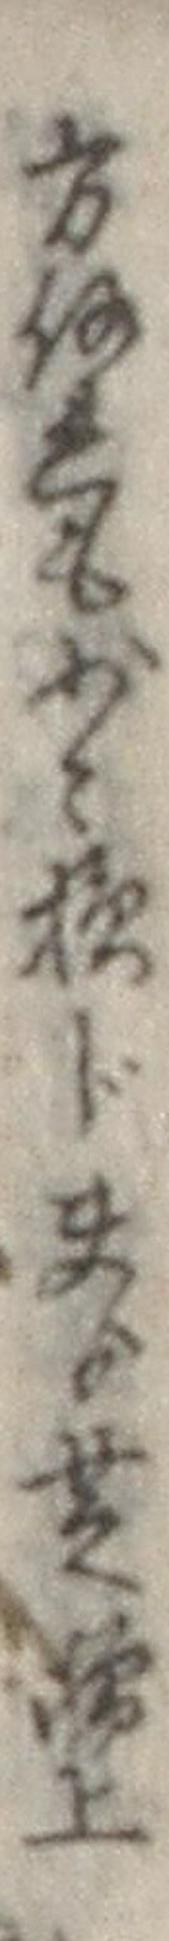片何れも少〻損じ夫ゟ芝増上
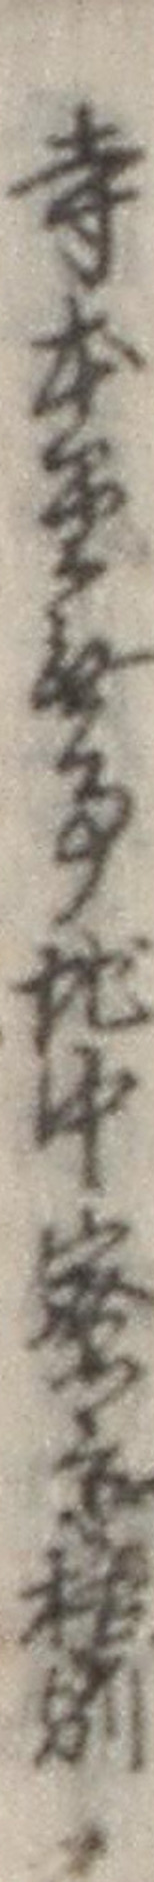寺本堂無事地中察方？格別
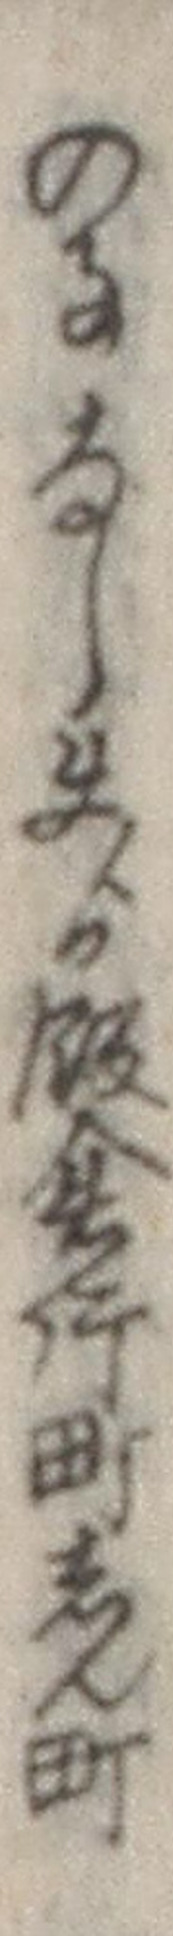の事なし夫ゟ飯倉行町しん町
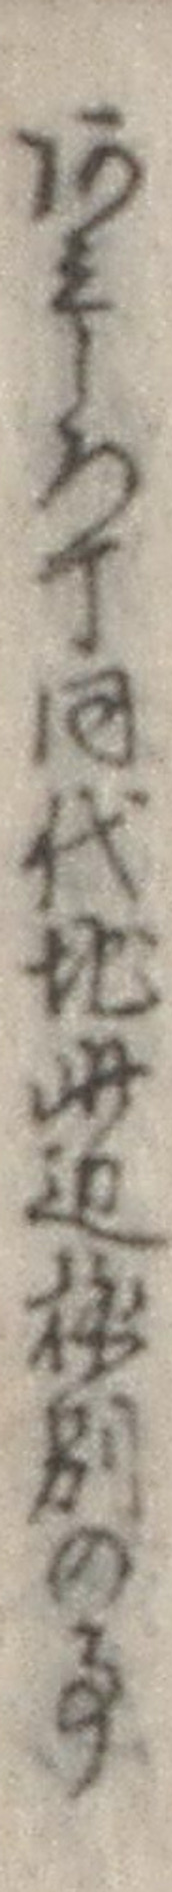あわしろ町同代地此辺格別の事
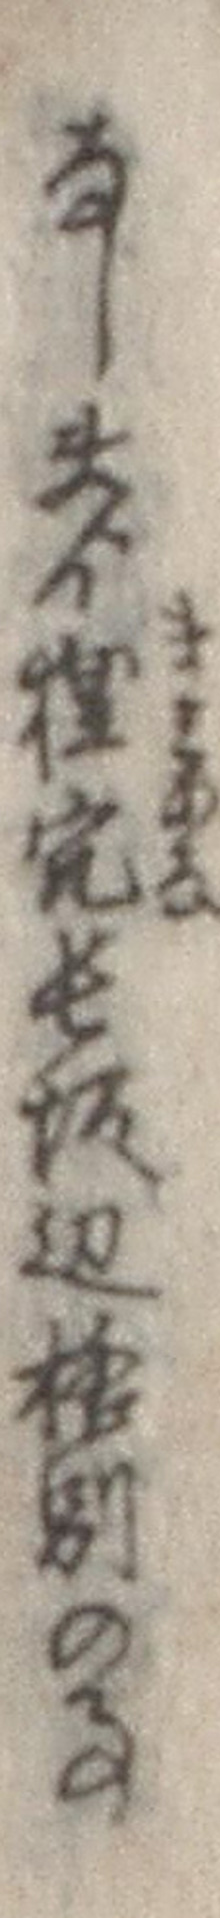なし夫ゟ-狸穴長坂辺格別の事
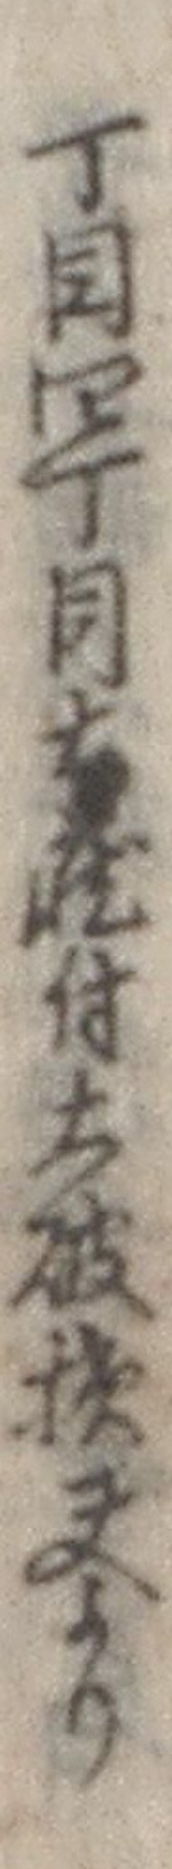丁目四丁目土蔵付大破損夫より
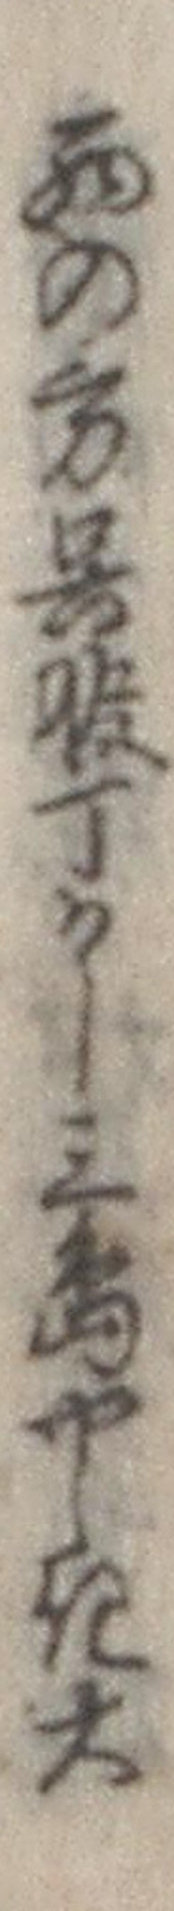西の方呉服丁かし三島やしき大
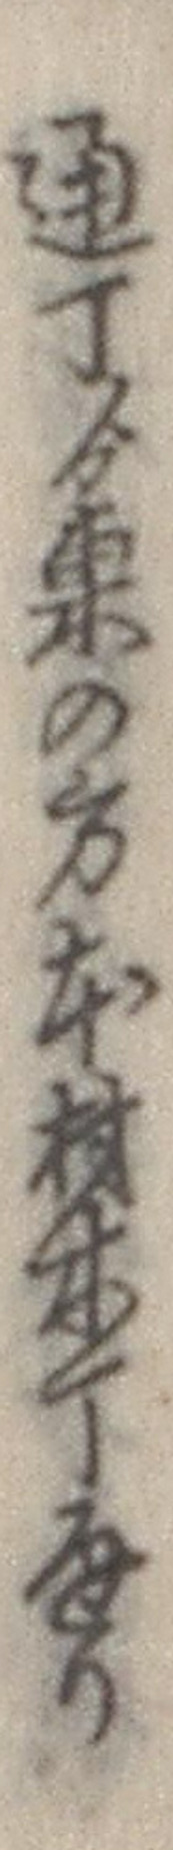通丁ゟ東の方本村木丁通り
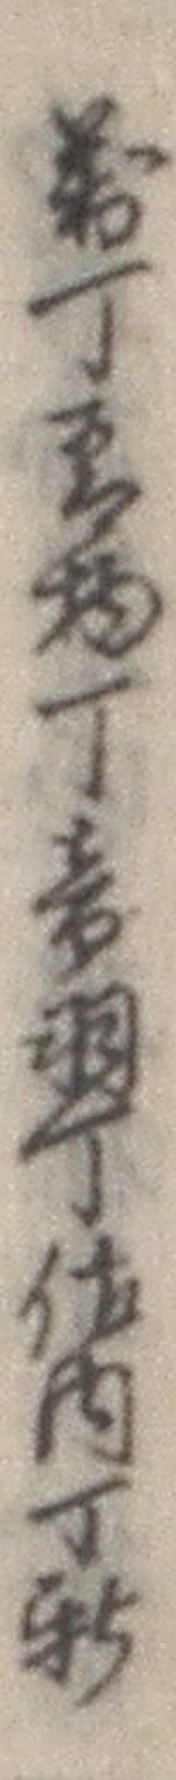萬丁青物丁音羽丁佐内丁新
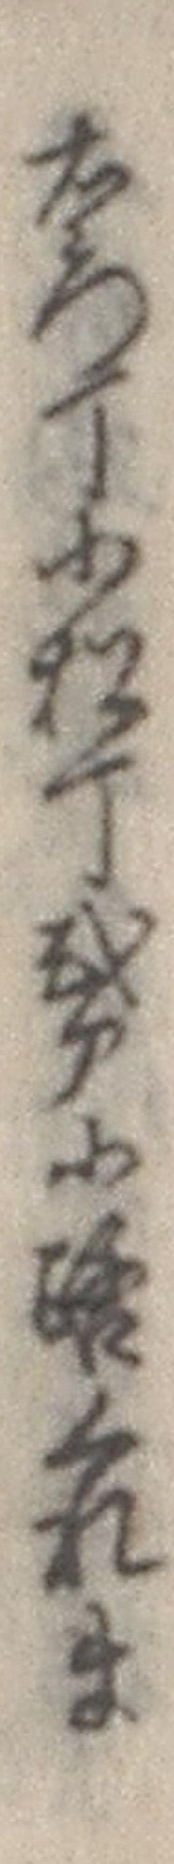右衛門丁小松丁式分小路くれま
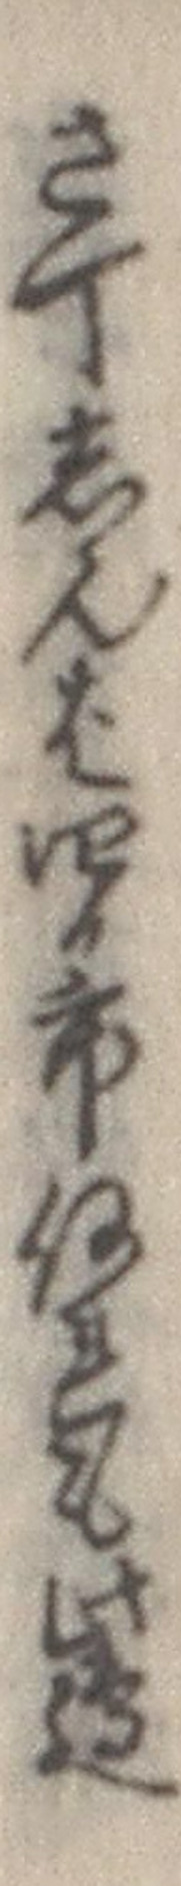さ丁しんは四ゟ市何れも此邊
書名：江戸　大地震臣細録　全
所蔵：東京大学地震研究所図書室 Earthquake Research Institute Library, The University of Tokyo, JAPAN
